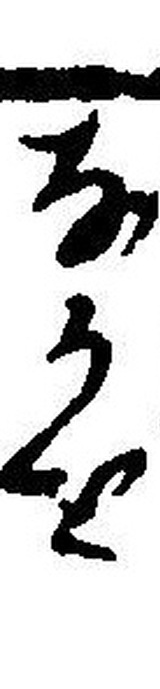なかを
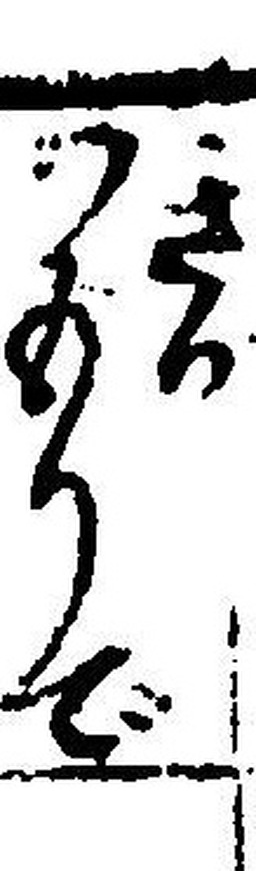つもりで
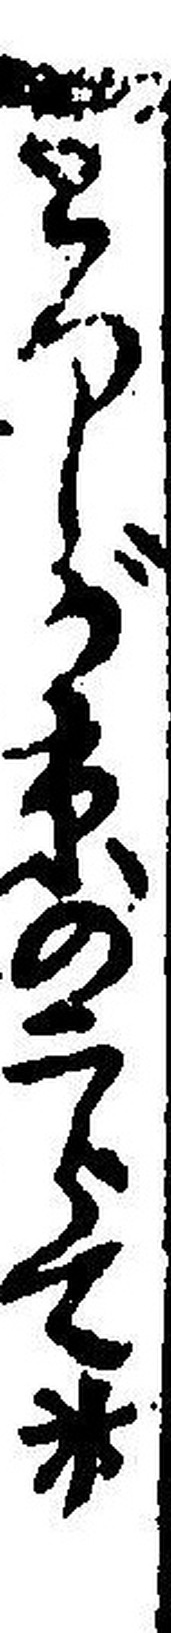とつしが京の二郎て
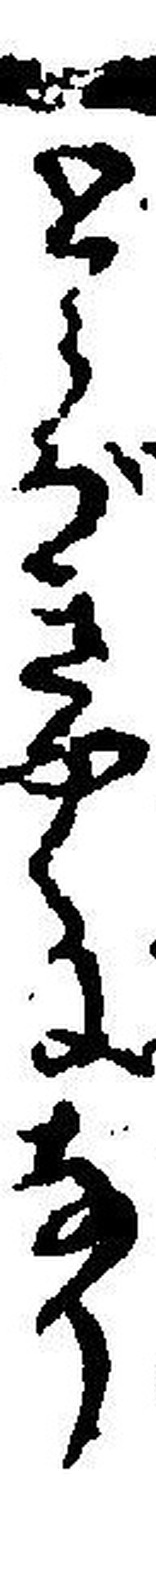とらがきやくになり
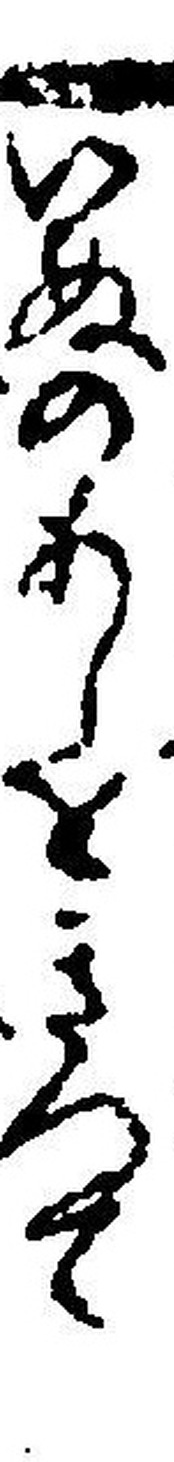いぬのあしをきつて
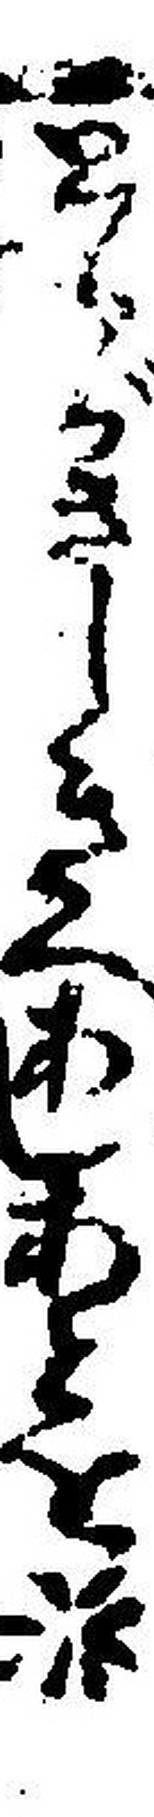とらがさしきへあしあとを
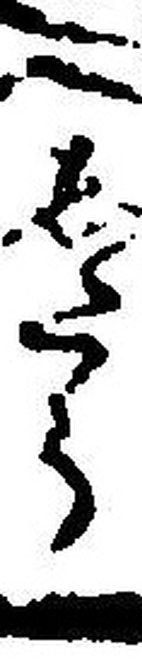したら
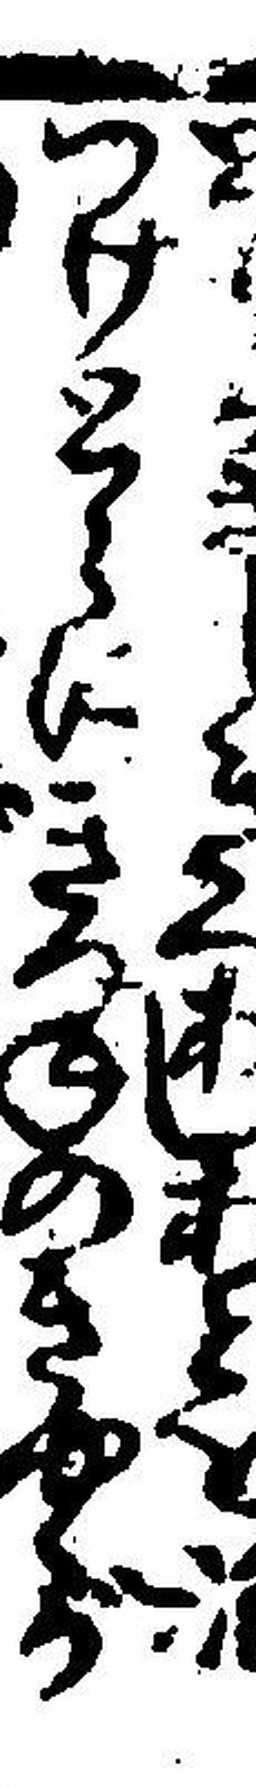つけとらにきつねのきやくが
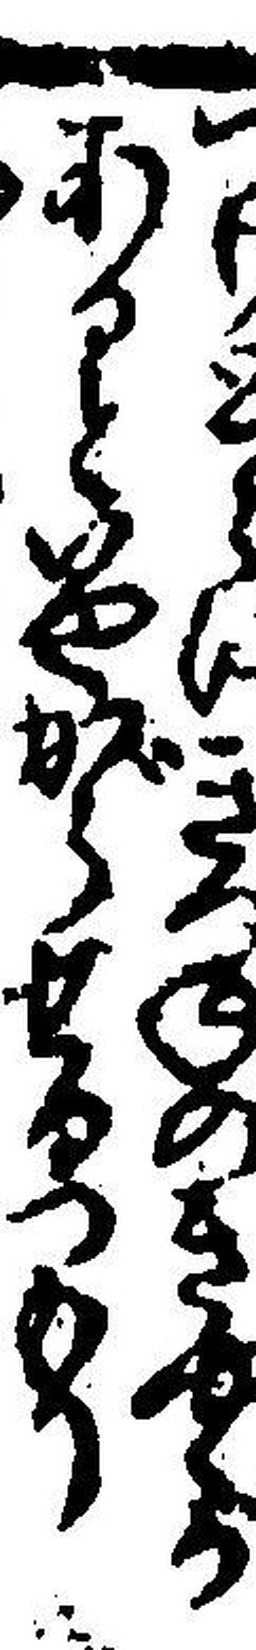あるといやがらせるつもり
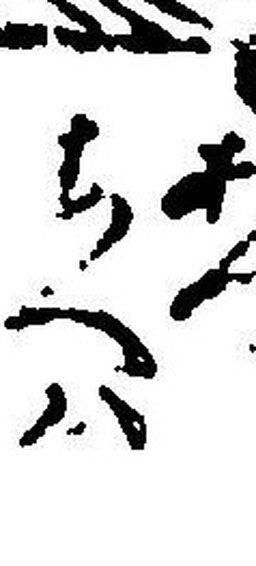ちへは
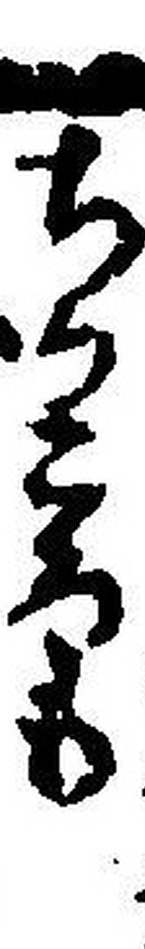ちかころも
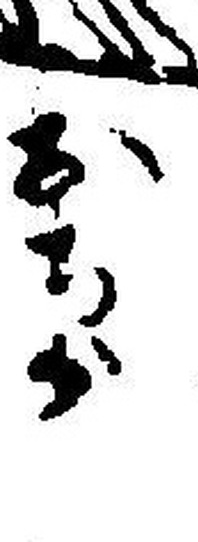おちか
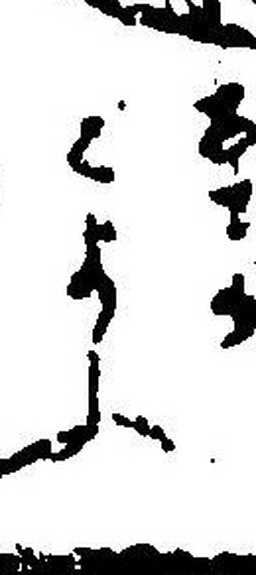こよふ
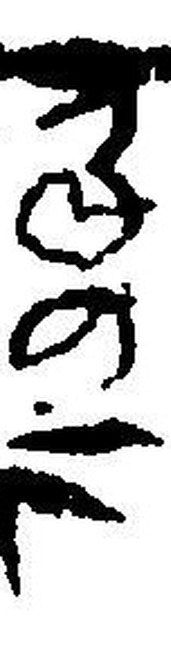つねの
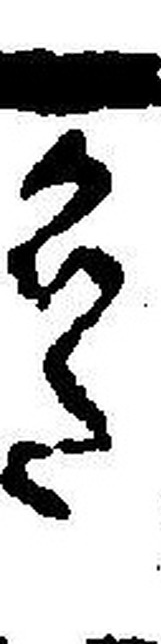かいた
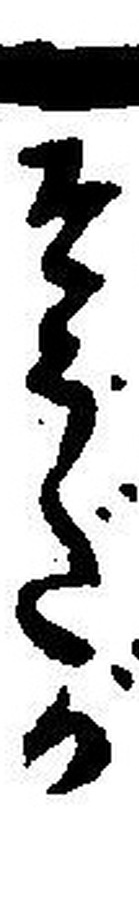そうだが
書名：間違狐之女郎買 / 市場通笑作
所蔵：東京大学総合図書館 General Library in the University of Tokyo, JAPAN
